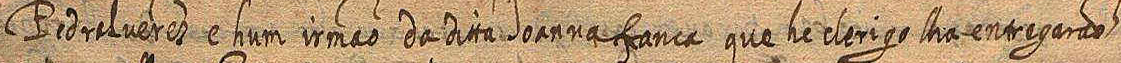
Pedralueres e hum irmão da ditta Ioanna franca que he clerigo lha entregarão
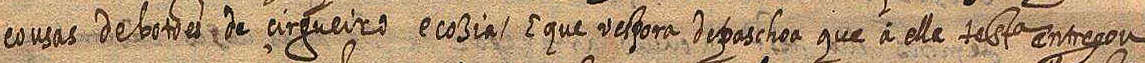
cousas de botões de cirgueiro e cozia / E que vespora de paschoa que a ella testa entregou
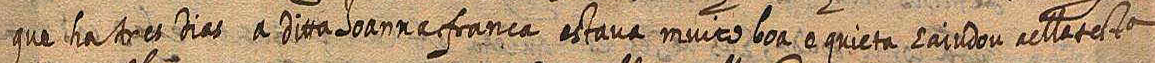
que ha tres dias a ditta Ioanna franca estaua muito boa e quieta E aiudou a ella testa
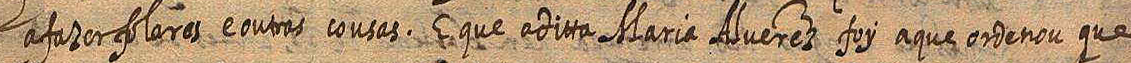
a fazer folares e outras cousas. E que a ditta Maria Aluerez foy a que ordenou que
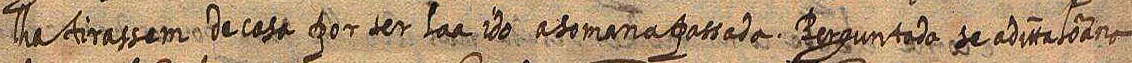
lha tirassem de casa por ter laa ido a somana passada. Perguntada se a ditta Ioāna
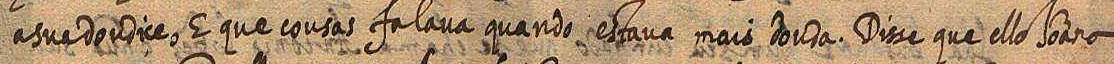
a sua doudice, E que cousas falaua quando estaua mais douda. Disse que ella Ioāna
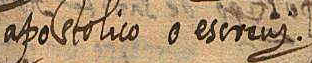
apostolico o escreuj.
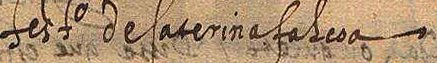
testo de Caterina falcoa
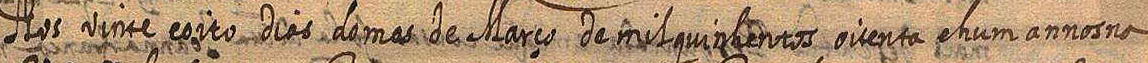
Aos vinte e oito dias do mes de Março de mil quinhentos oitenta e hum annos na
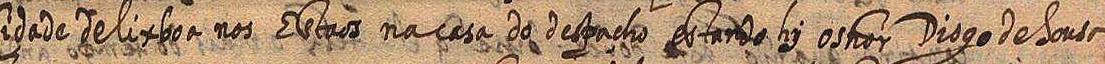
Cidade de lixboa nos Estaos na casa do despacho estando hy o snōr Diogo de Sousa
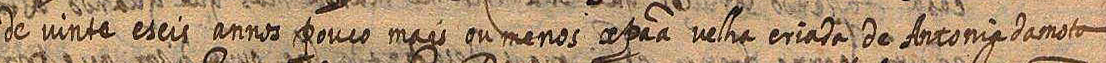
de uinte e seis annos pouco mais ou menos xpaā uelha criada de Antonia da mota
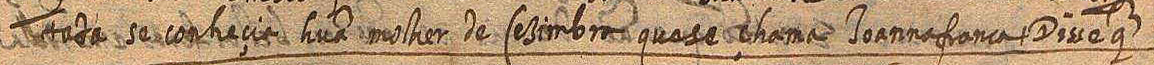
tada se conhecia huā molher de Cezimbra que se chama Ioanna franca, Disse q̄
